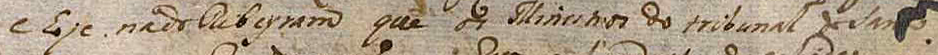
e hoje na do Ribeyram que os Ministros do tribunal do san_o
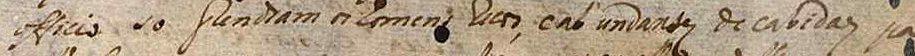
officio so pRendiam os homens Ricos, e abundantes de cabidaes pa
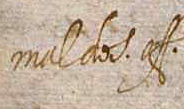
mal do S. off.o
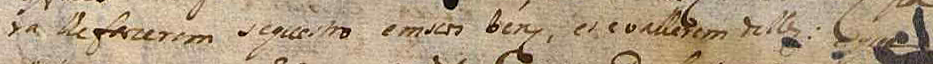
ra lhe fazerem sequestro em seos bens, e se vallerem delles: que
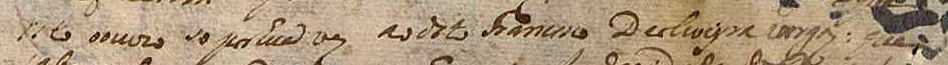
isto o ouvio so por hua ves ao dito Francisco De oliveyra vargas: que
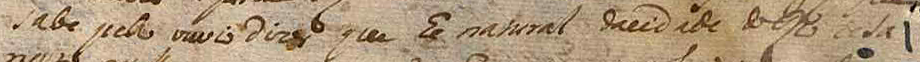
sabe pello ouvio dizer que he natural da cidade do Rio de Ia
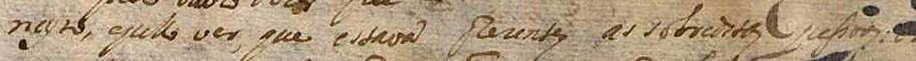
neyro, e pello ver, que estavā pRezentes as sobreditas pessoas:
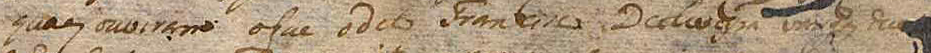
quaes ouviram o que o dito Francisco De oliveyra vargas dice
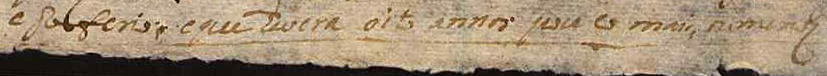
e pRoferio, e que havera oito annos pouco mais ou menos
